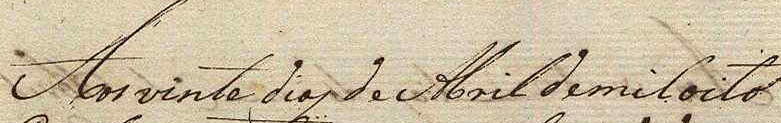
Aos vinte dias de Abril de mil oito
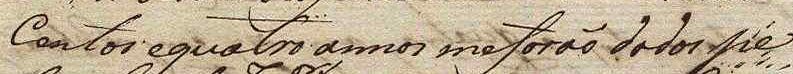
Centos e quatro annos me foraõ dados pé
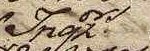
Inqz.ors
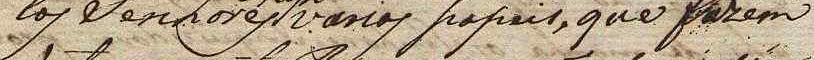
los Senhores varios papeis, que fazem
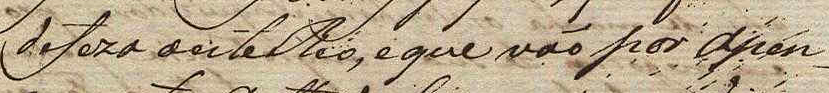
defeza a este Reo, e que vaõ por apen
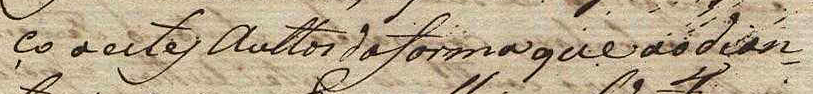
ço a estes Auttos da forma que aodian
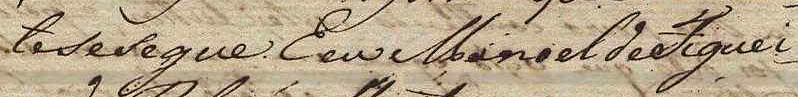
te se segue. E eu Manoel de Figuei
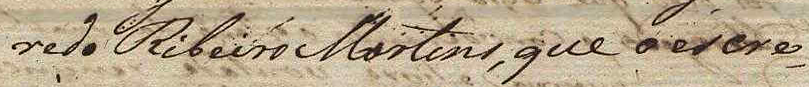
redo Ribeiro Martins, que o escre
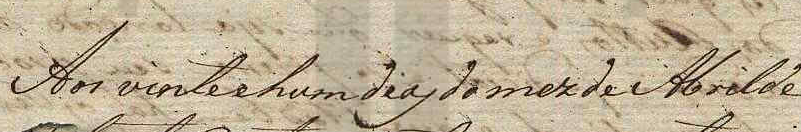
Aos vinte e hum dias do mez de Abril de
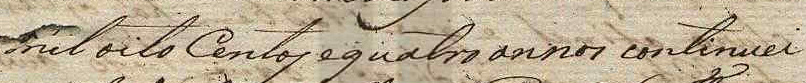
mil oitoCentos e quatro annos continuei
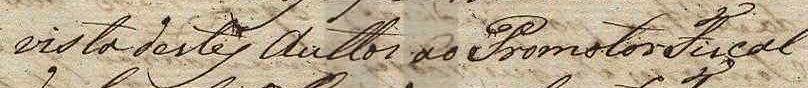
vista destes Auttos ao Promotor Fiscal
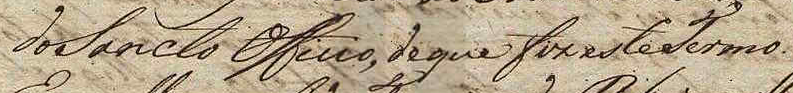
do Sancto Officio, de que fiz este Termo.
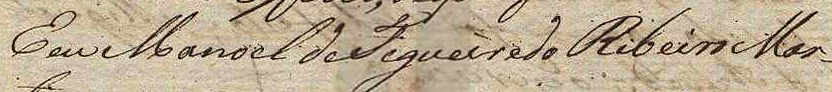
E eu Manoel de Figueiredo Ribeiro Mar
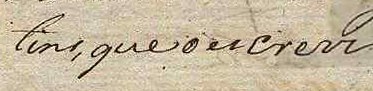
tins, que o escrevi
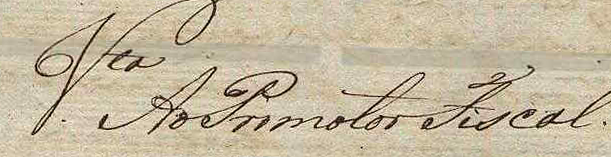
V.ta Ao Promotor Fiscal.
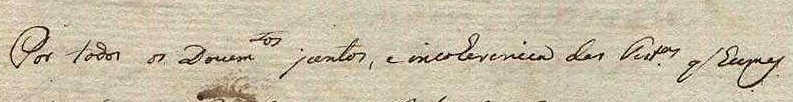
Por todos os Docum.os juntos, e incoherencia das Test.as q̄ humas
